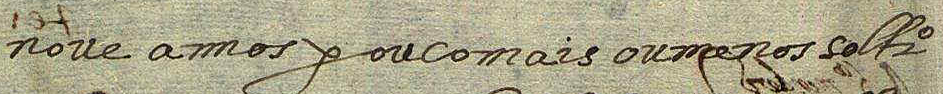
noue annos pouco mais ou menos soltro
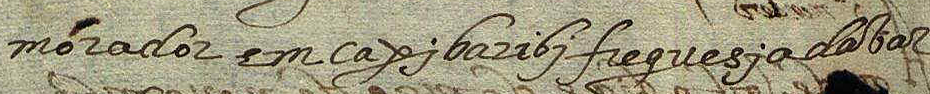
morador em capjbaribj freguesja da var
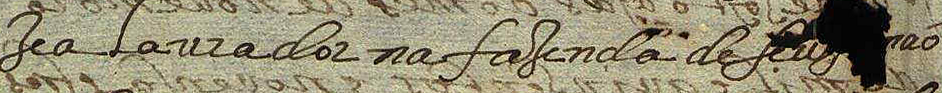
zea Laurador na fazenda de seu __naõ
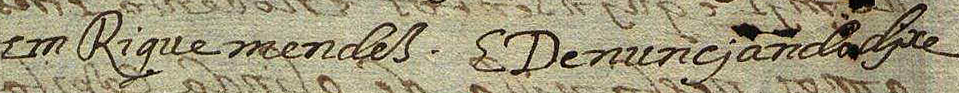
EmRique mendez. E Denuncjando djxe
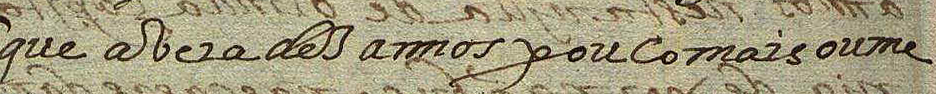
que avera dez annos pouco mais ou me
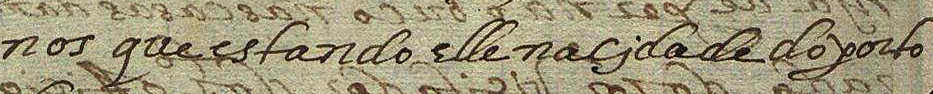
nos que estando Elle na cjdade do porto
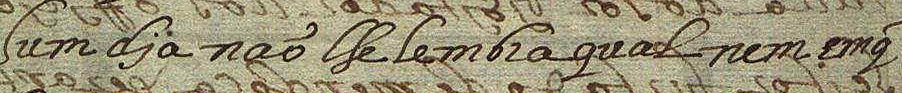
hum dja naõ lhe lembra qual nem em q̄
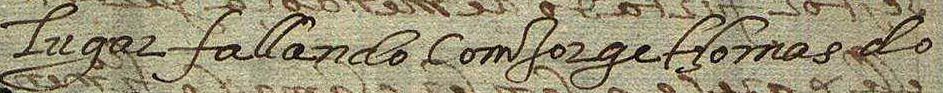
lugar fallando com Jorge thomas do
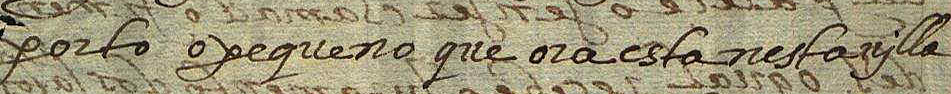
porto o pequeno que ora esta nesta ujlla
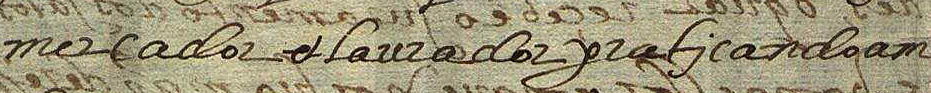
mercador & Laurador pratjcando am
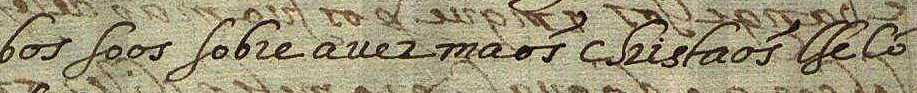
bos soos sobre auer maos̄ christaos̄ lhe Cō
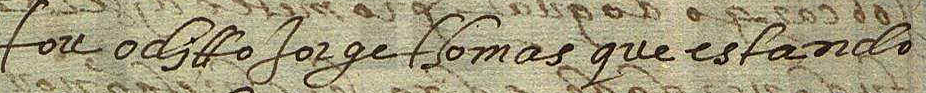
tou o djtto Jorge thomas que estando
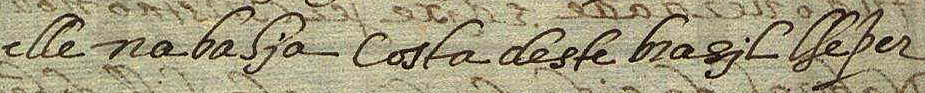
elle na bahja Costa deste brasjl lhe per
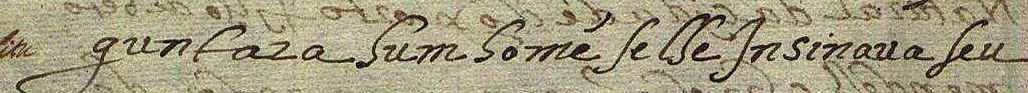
guntara hum homē se lhe Jnsinaua seu
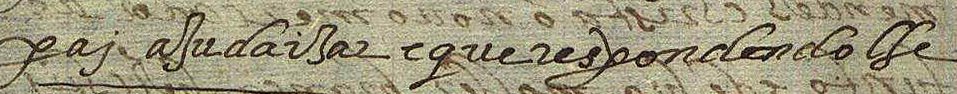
paj a Judaizar e que respondendo lhe
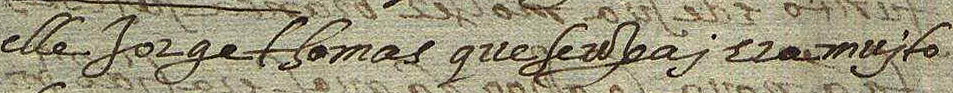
elle Jorge thomas que seu paj Era mujto
